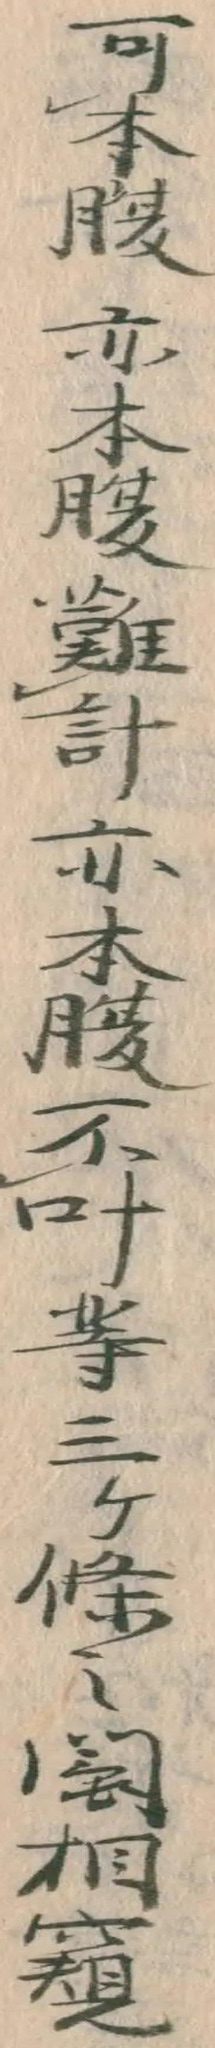可本腹亦本腹難計亦本腹不叶等三ケ條之鬮相窺
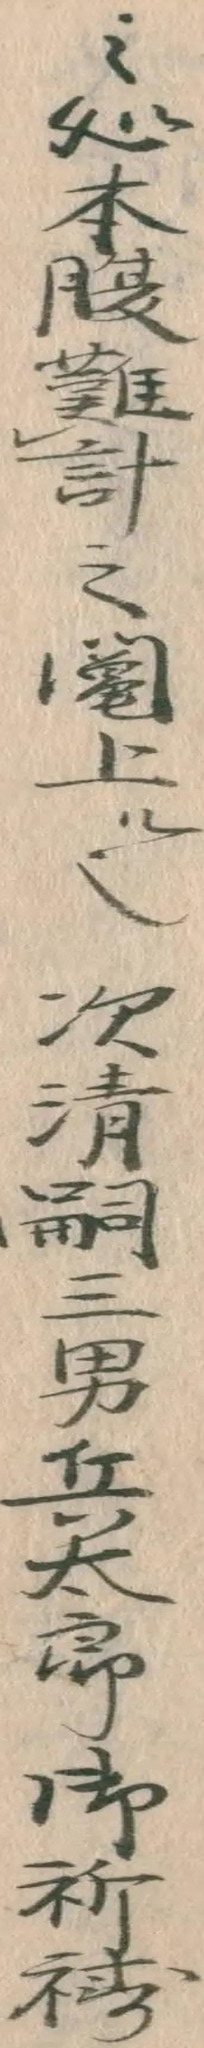之処本腹難計之鬮上ル也次清嗣三男兵太郎御祈祷
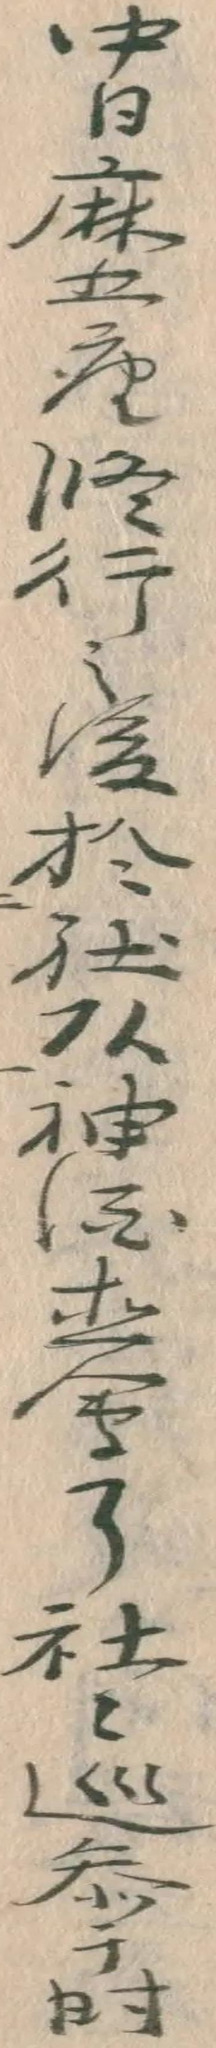中日麻五座修行之後於社頭神酒直會了社々巡参于時
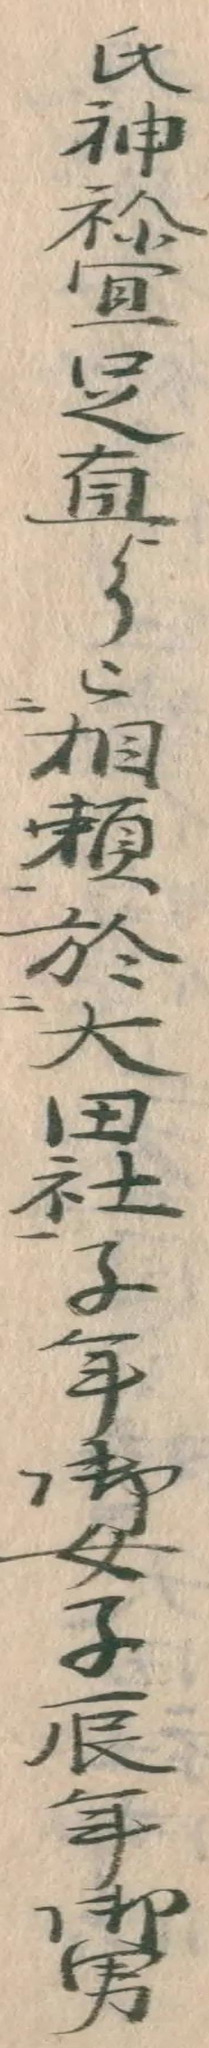氏神祢宜足直より被相頼於大田社子年御女子辰年御男
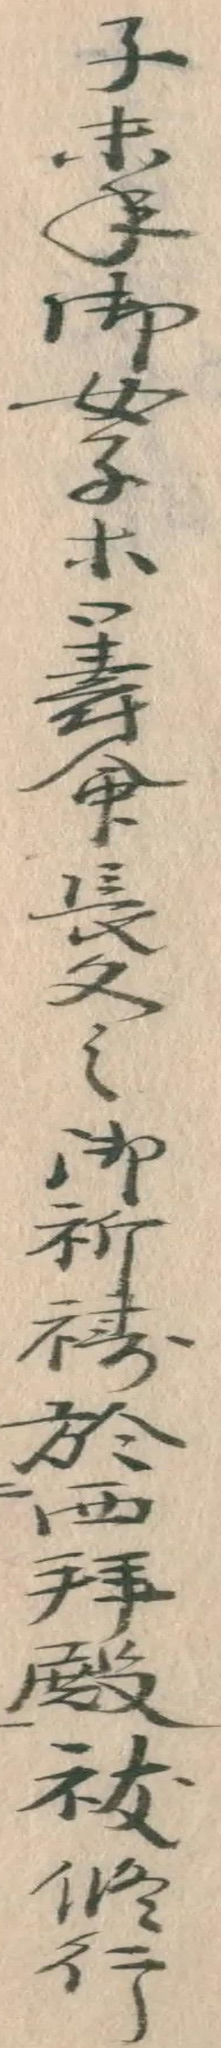子未年御女子等御壽命長文之御祈祷於西拝殿祓修行
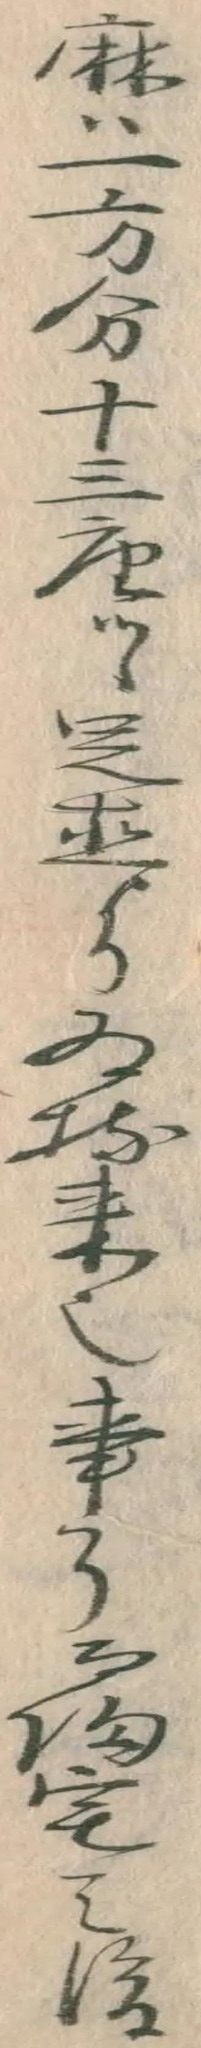麻ハ一方分十三座ツヽ足直より為持来也事了而帰宅之後
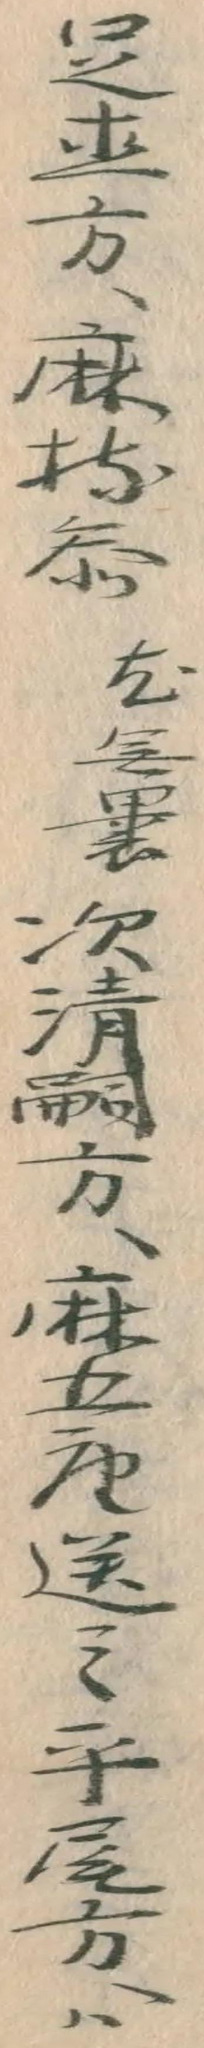足直方へ麻持参尤無包次清嗣方へ麻五座送之平尾方ヘハ

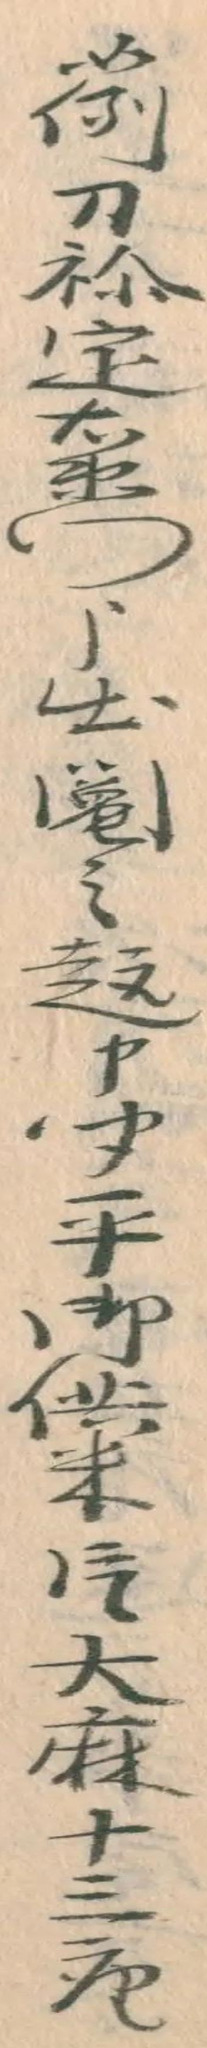如例刀祢定右衛門申出鬮之趣申聞平御供米片大麻十三座
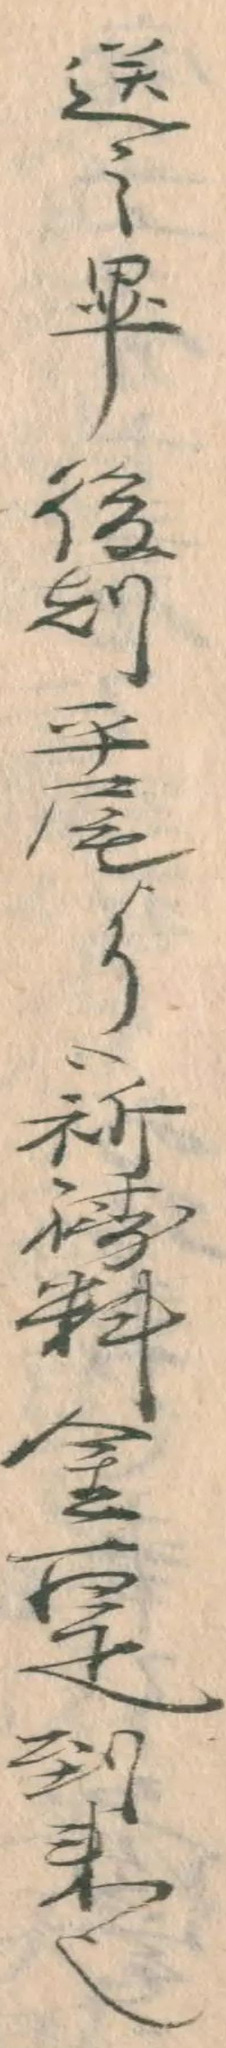送之畢後刻平尾より御祈祷料金百疋到来也
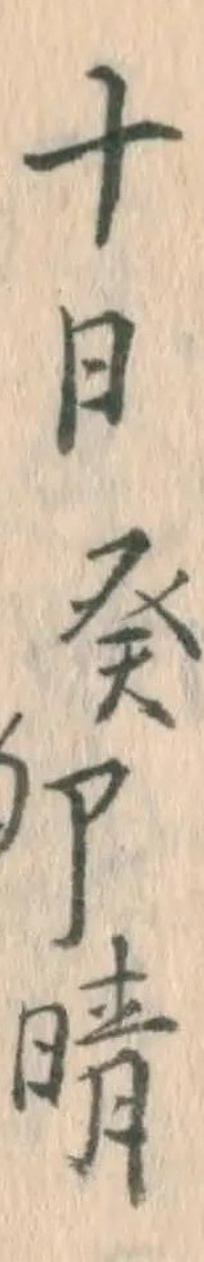十日癸申晴
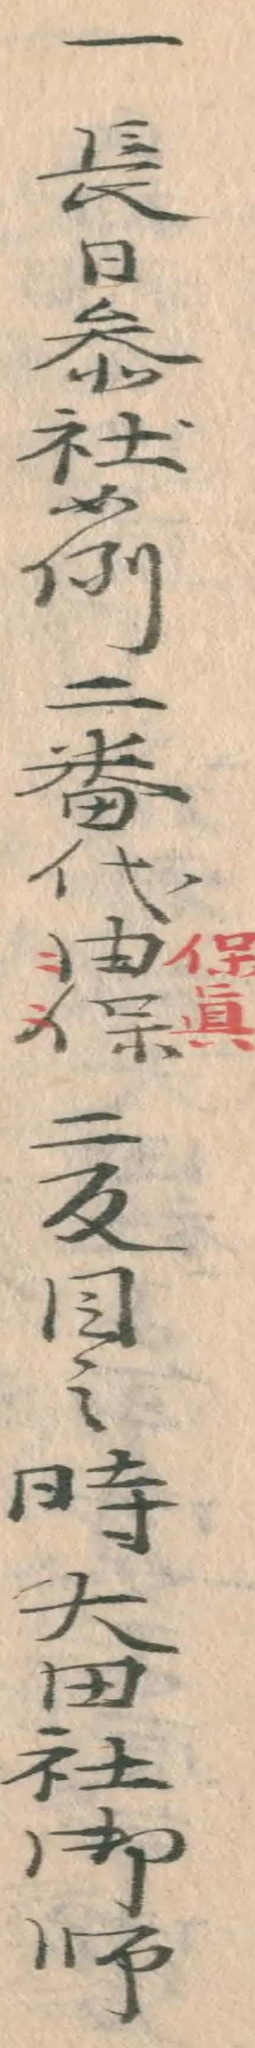一長日参社如例二番代由保二反目之時大田社御師
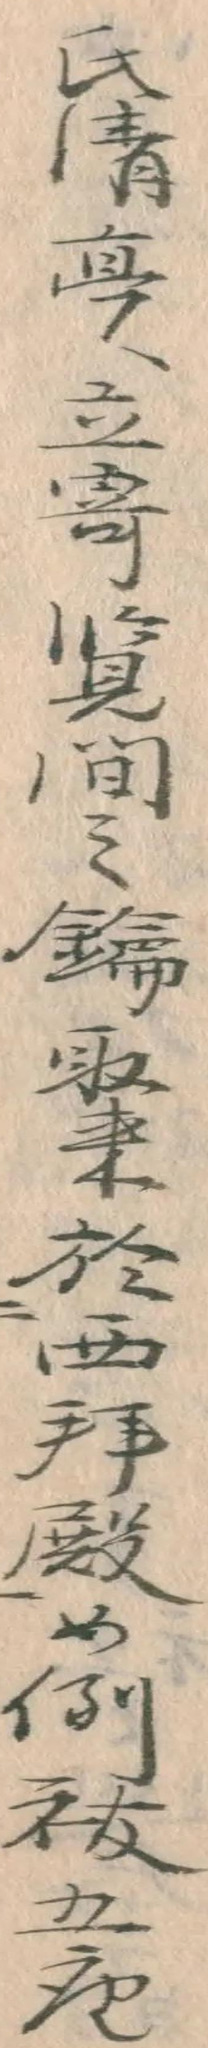氏清亭へ立寄覧間之鑰取来於西拝殿如例祓五座
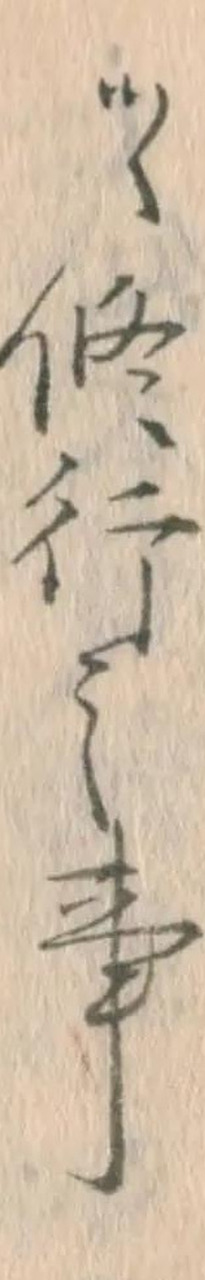ツヽ修行之事
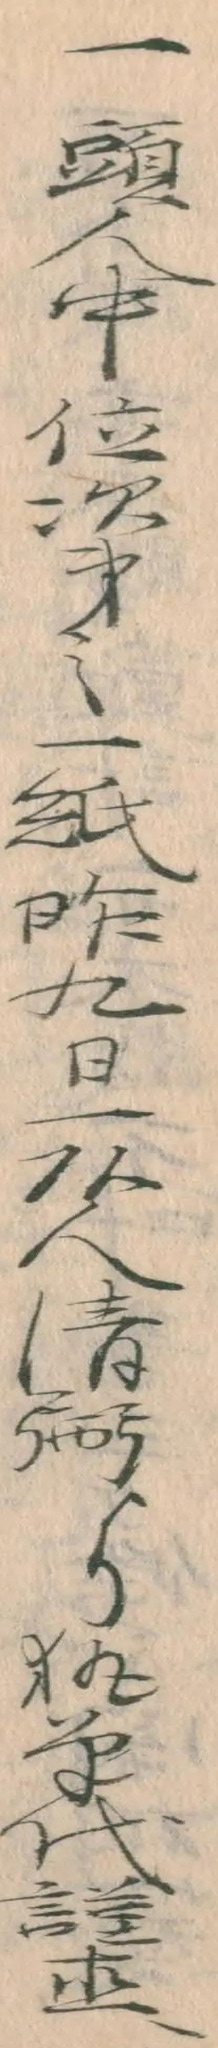一頭人中位次第之一紙昨九日一頭人清弼より執筆代謹直
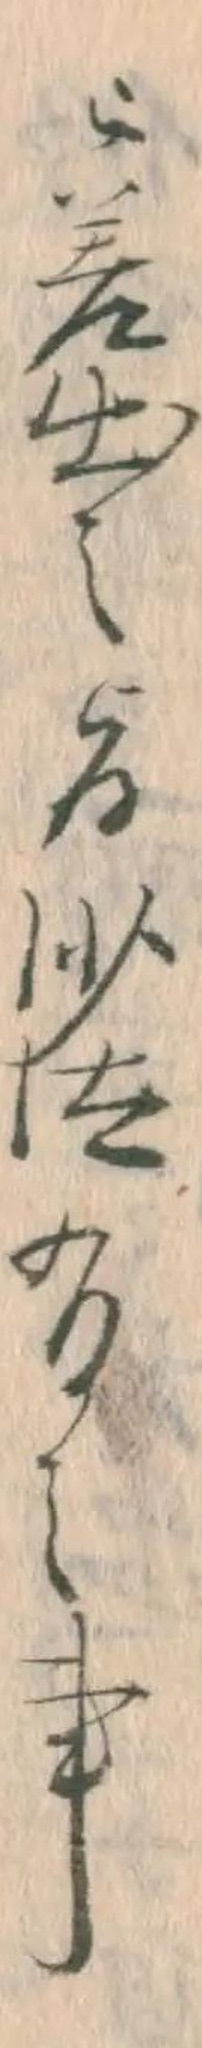被差出之旨沙汰有之事
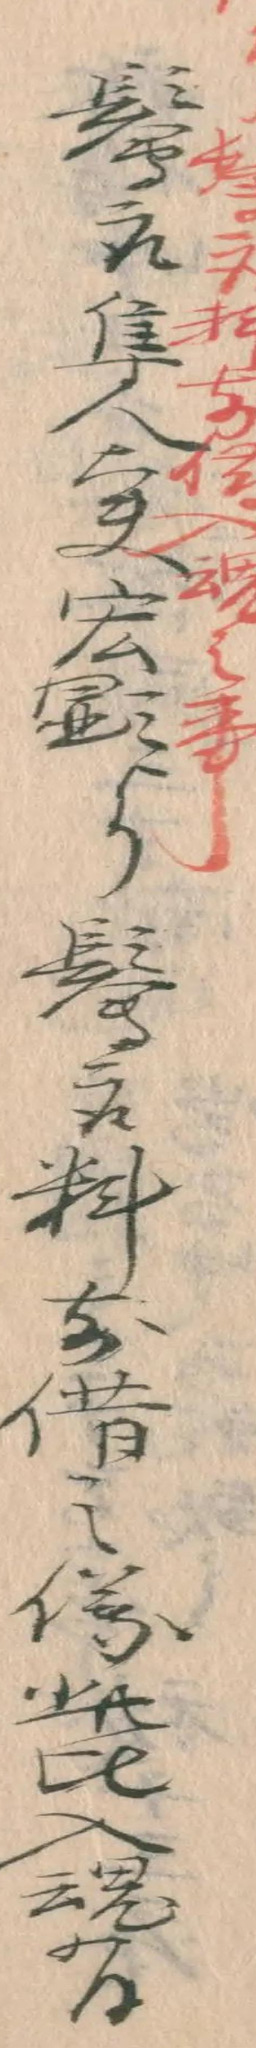一鬢取隼人大夫宏顕より鬢取料前借之儀此比入魂有
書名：賀茂社記録. 第73冊
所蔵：国立国会図書館 National Diet Library, JAPAN
